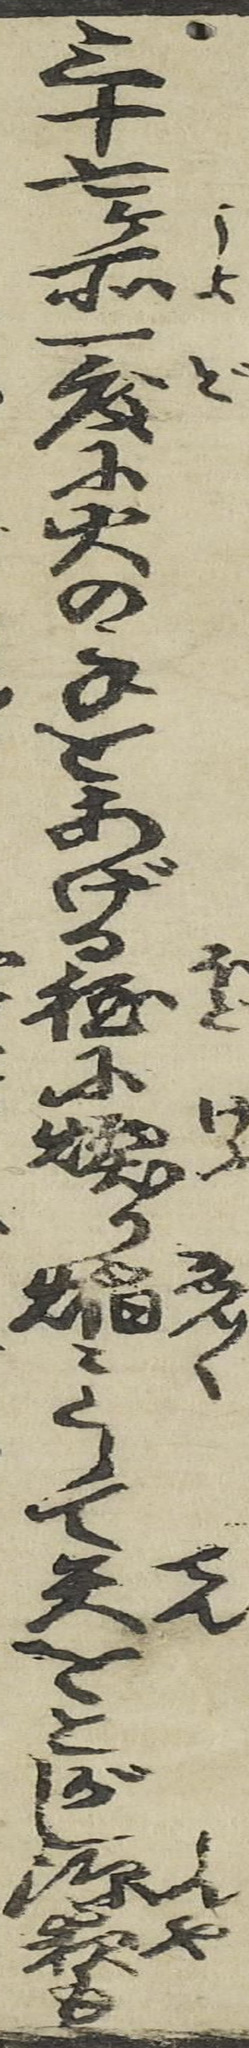三十七ヶ所一度に火の手をあげる程に煙り焔々として天をこがし深夜も
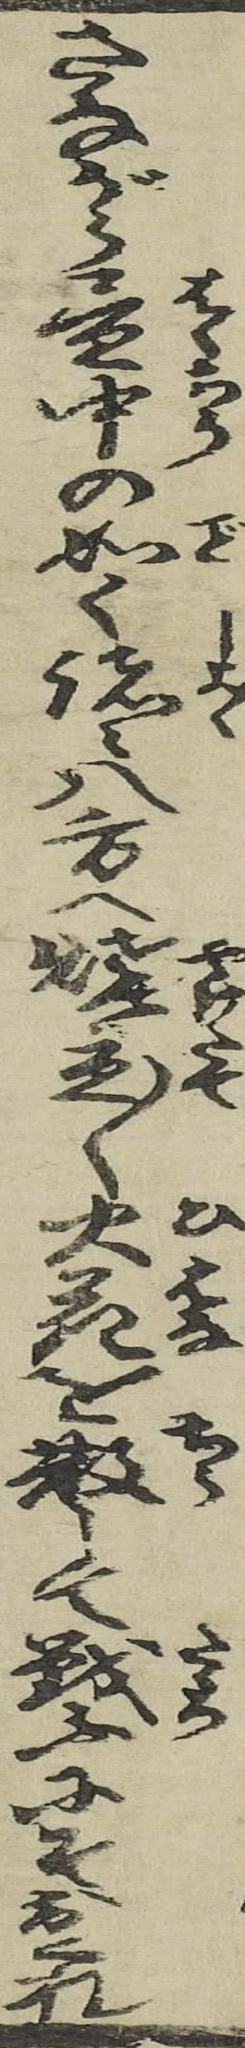さながら昼中の如く諸々八方へ焼立〳〵火花を散して戦ふにそおくれ

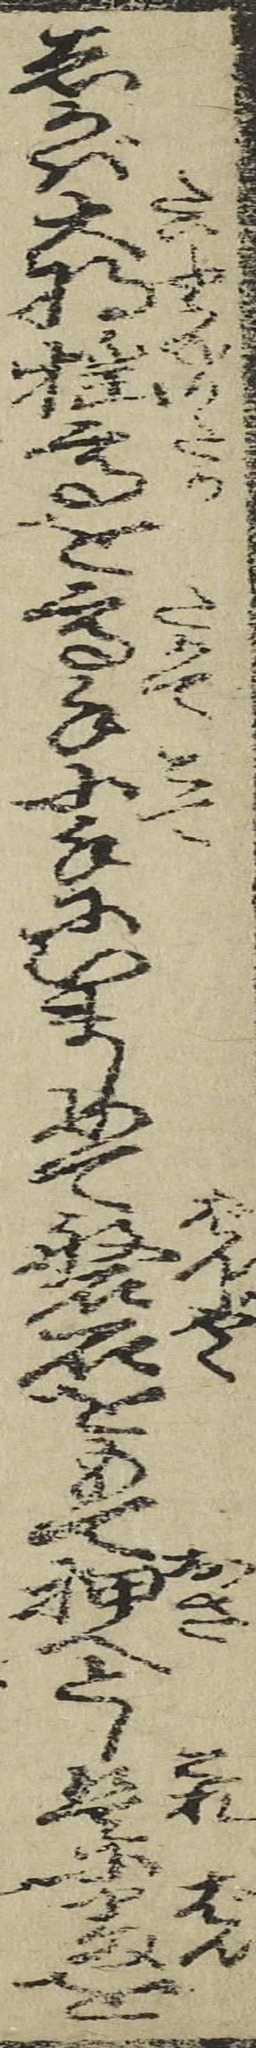しかば大将揺高を高手小手にいましめて盤石をもて押へて是に番を
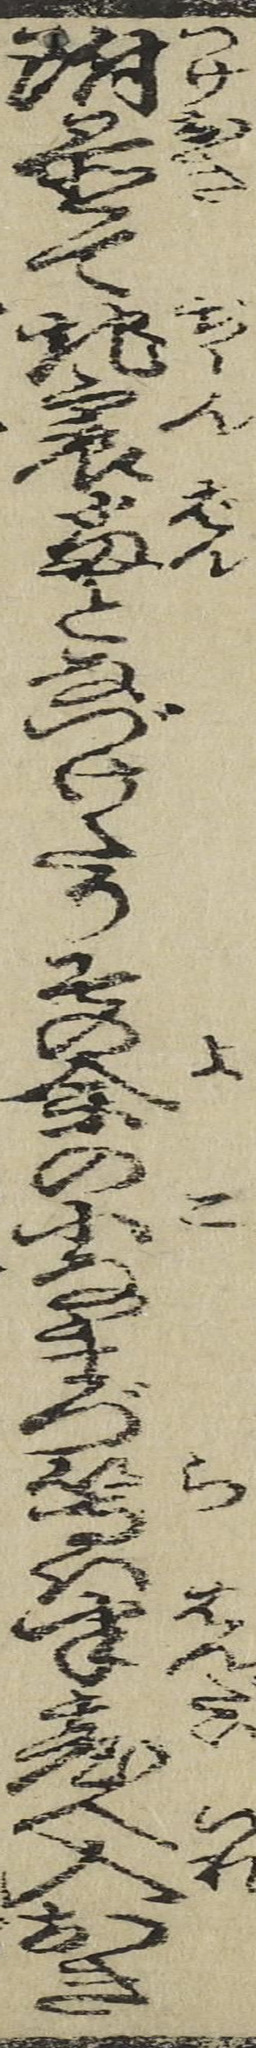附置て地震番となづけたりその余の小なまづ等は半台へ入おき
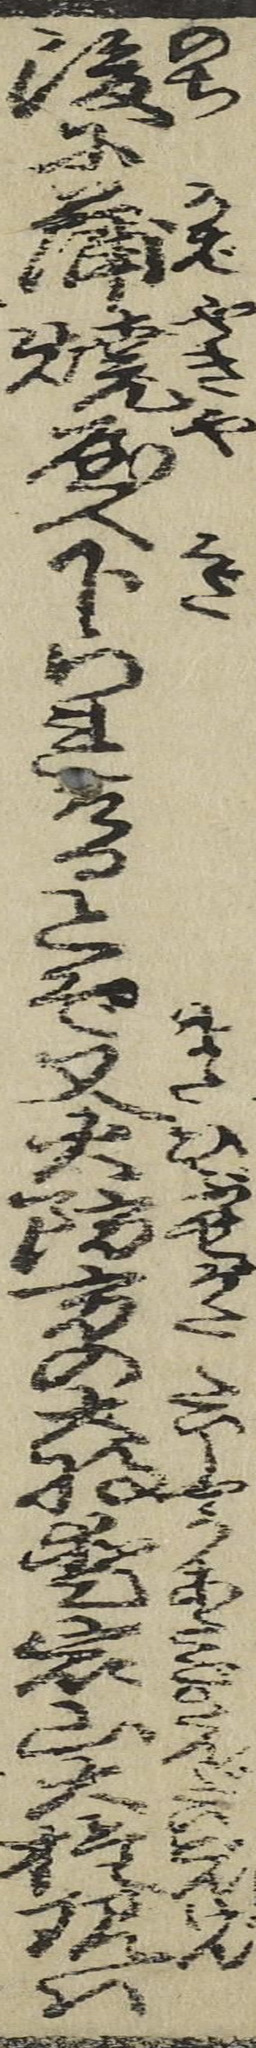後に蒲焼屋へ下はれけるとぞ又火防方の大将愛宕山大権現は
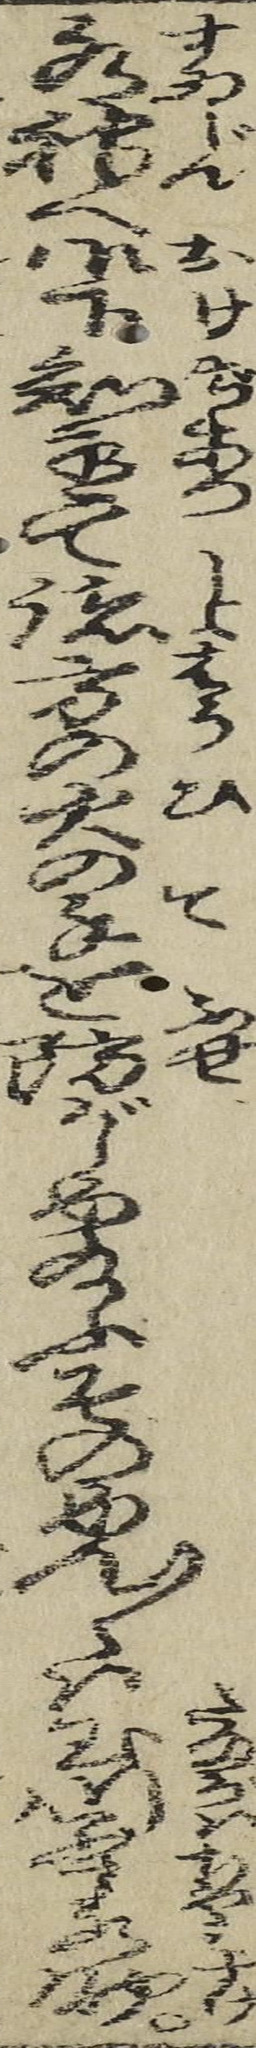水神へ御下知有て諸方の火の手を防がしめ給ふそのめん〳〵は玉川早水助
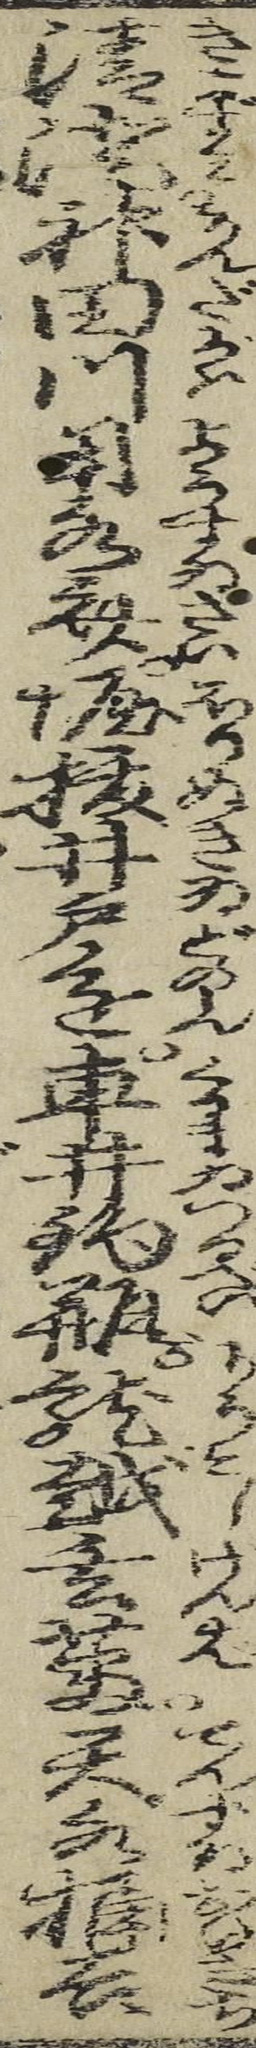清水神田川用水斉掘抜井戸進車井釣瓶龍越玄蕃天水桶吉
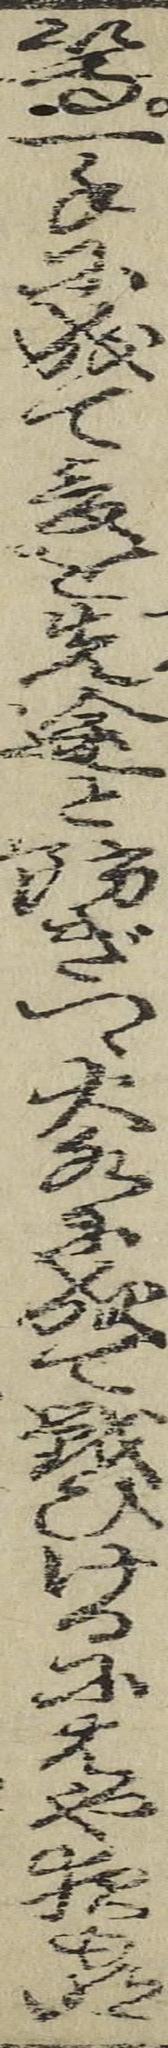等一手に成て爰を先途と防びつゝ火水に成て戦ひけるにはや夜も明
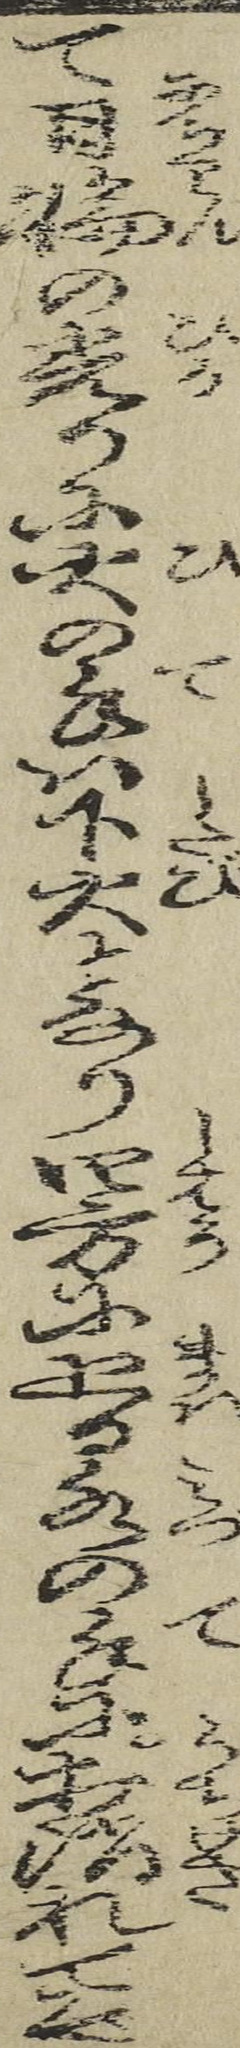て日輪の光りに火の手は下火となり四方に廻る水の手に打消れてそ
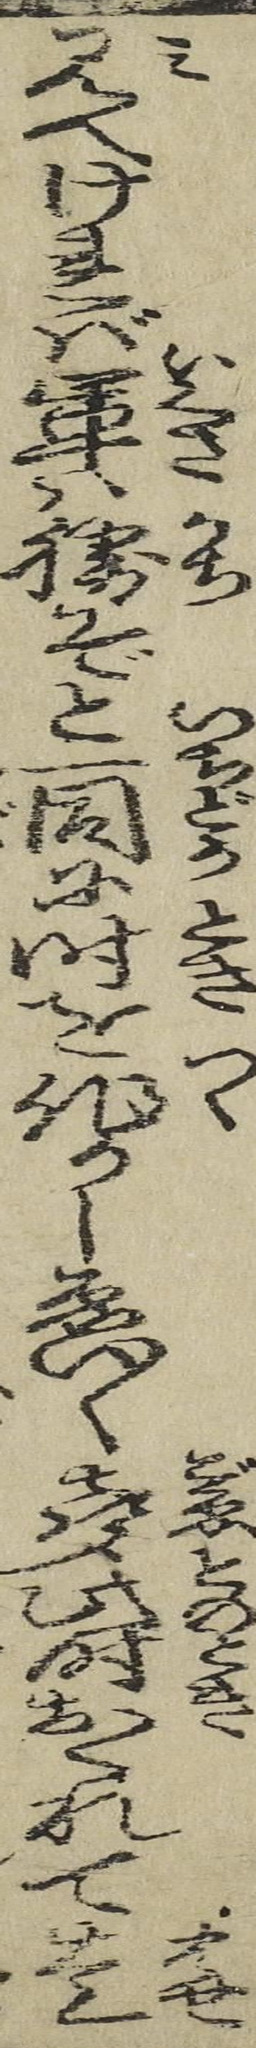見んければ軍は勝ぞと一同に時を作りしわい〳〵声此時おくれて走
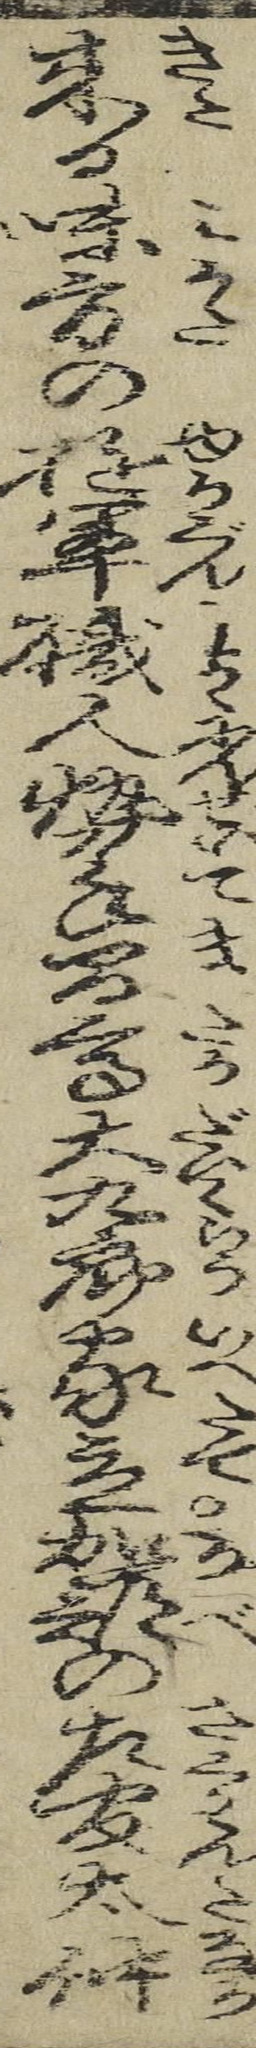来る味方の遊軍職人勢手間高大九郎家立加部の左官太仲
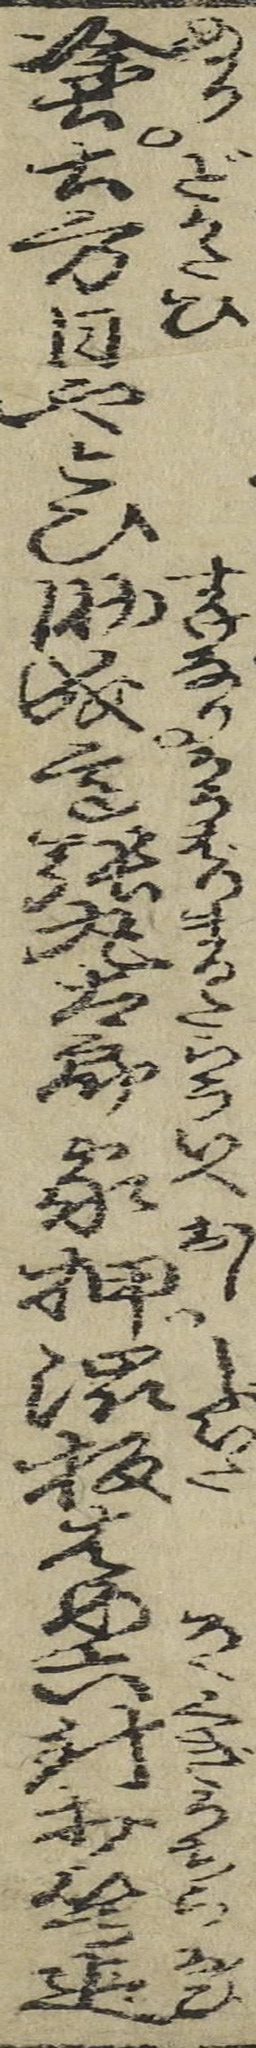塗土方日やとひ助成豪張丸太郎家押渋板はま六釘打等追

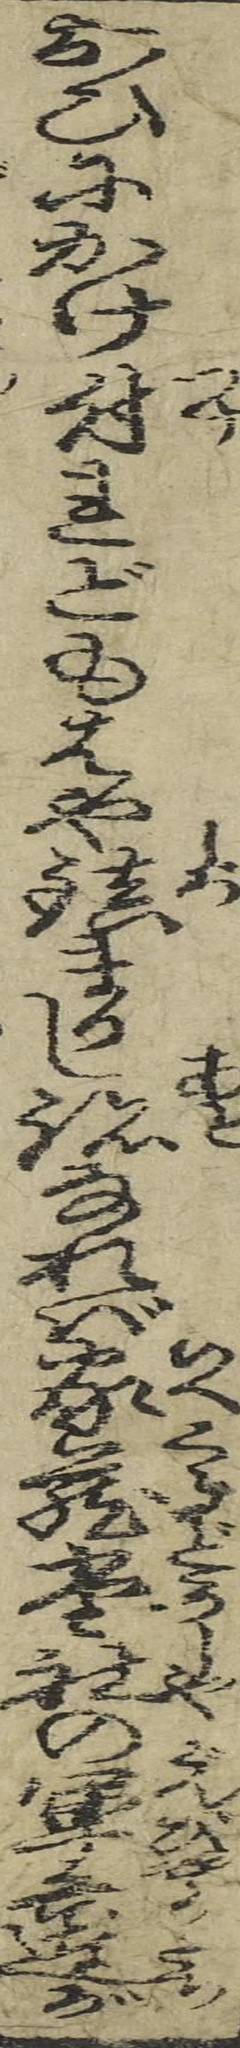おひにかけ付れどもはや鎮まりし跡なれば家蔵堂社の軍兵達が
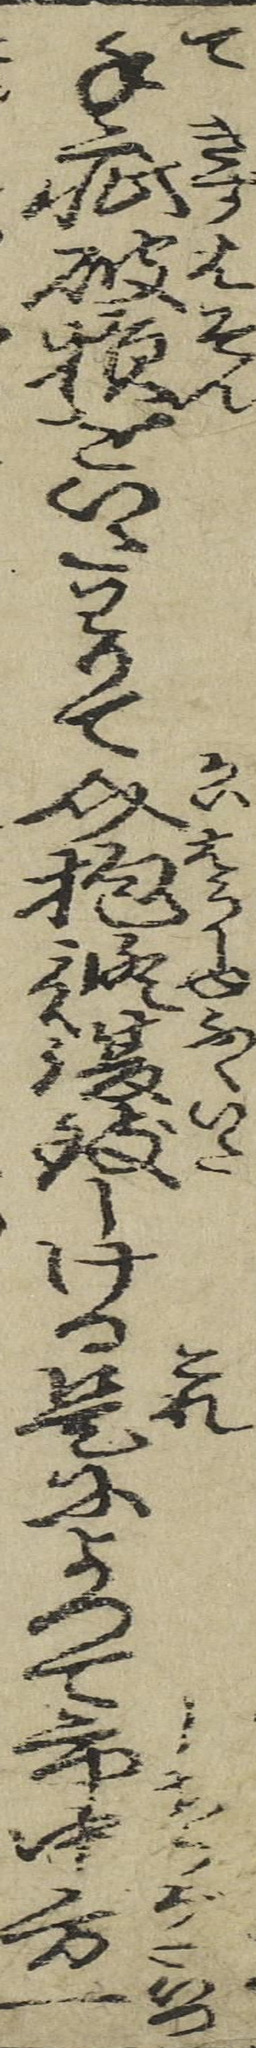手疵破損をいたわりて介抱修復致しける是によつて市中方一
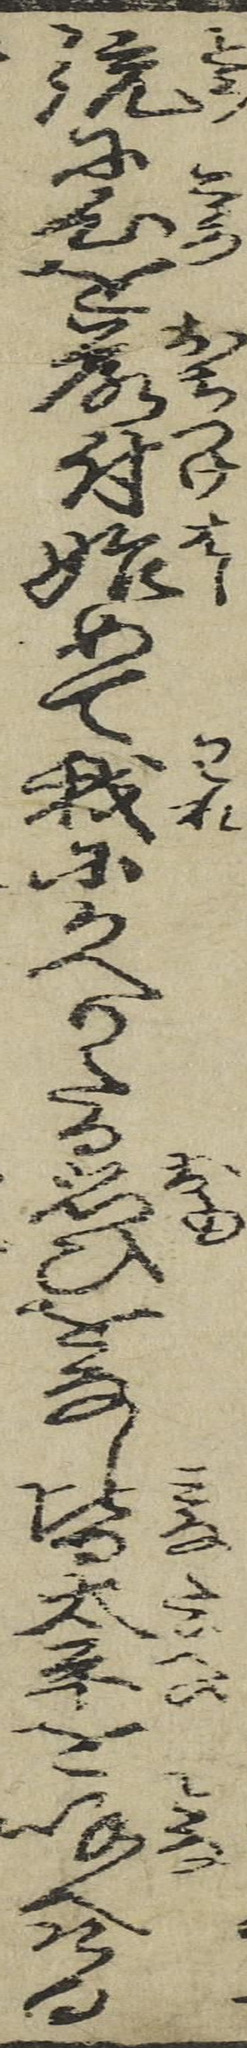統に心を落付始めて我にかへりたる思ひをなし皆太平を唱へける
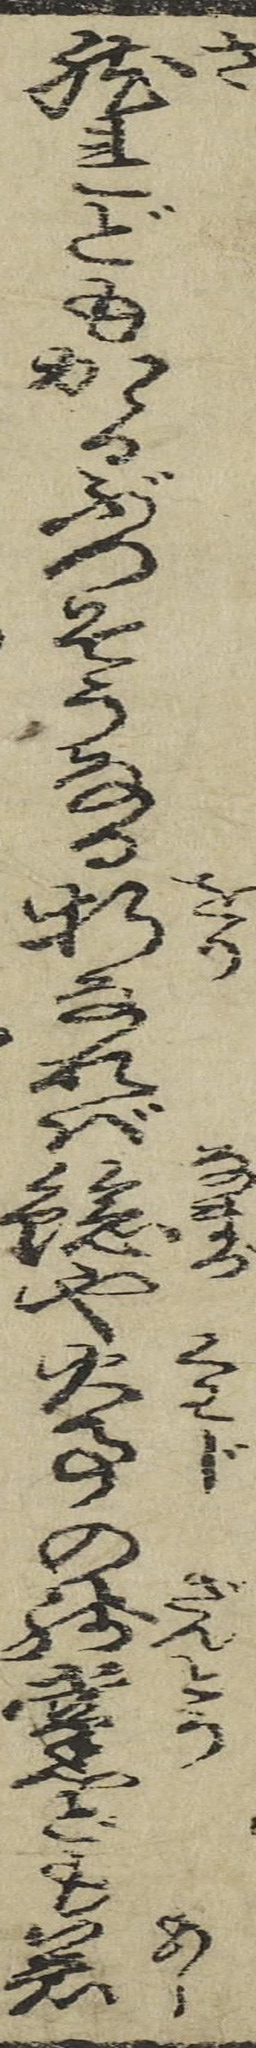然れどもかゝるぶつそうなる折なれば鯰や火事の残党ども若
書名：安政大地震畧記　全
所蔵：東京大学地震研究所図書室 Earthquake Research Institute Library, The University of Tokyo, JAPAN
